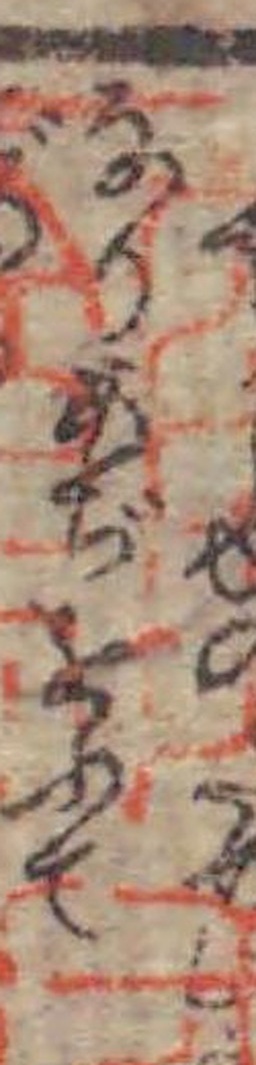なりあぢをふて
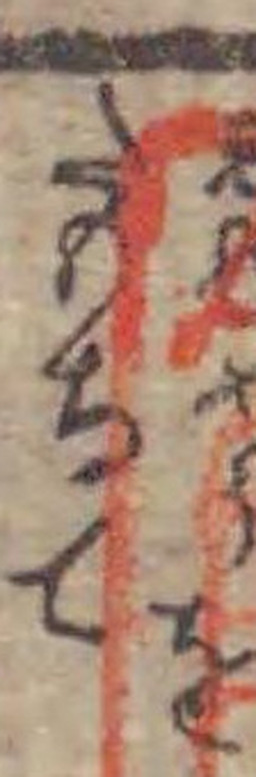たもちて
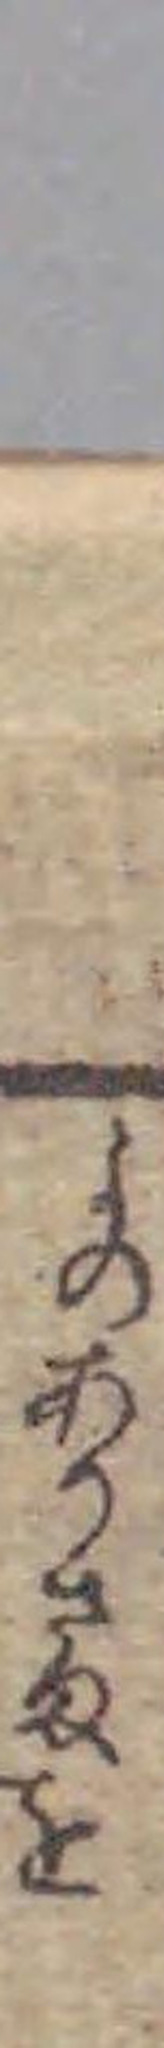よのありさまを
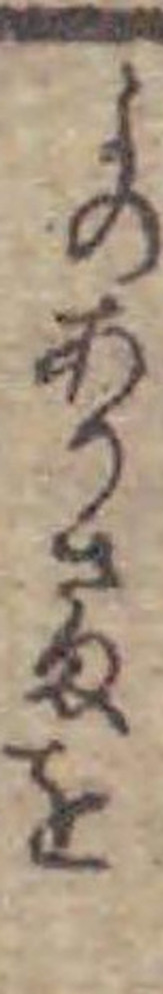よのありさまを
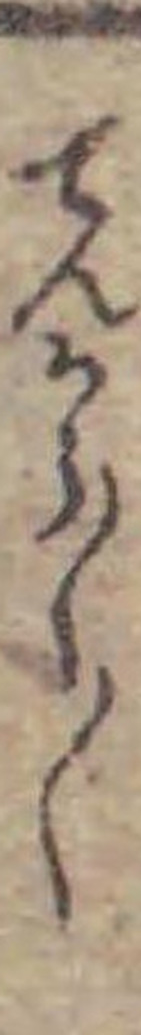てんから〳〵〳〵
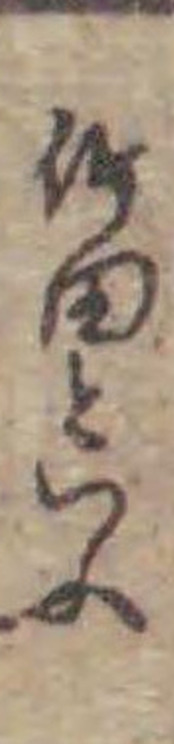竹田といふ
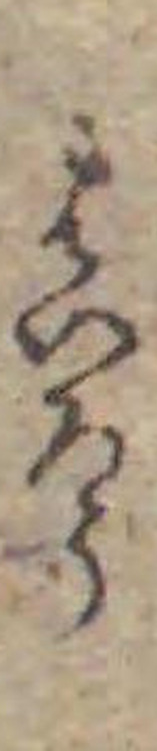はいろう

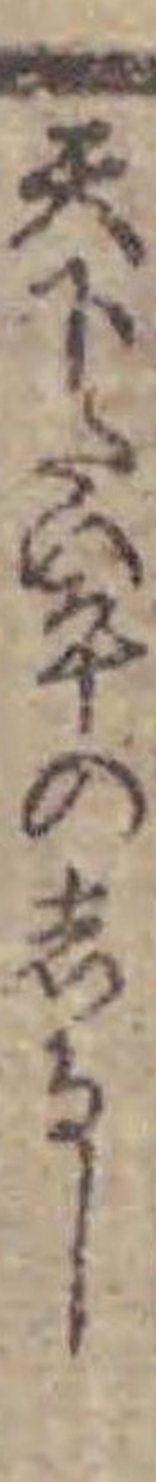天下たい平のしるし
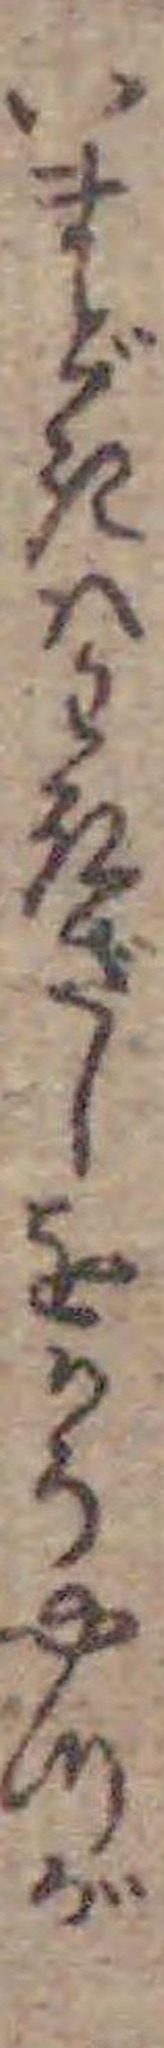いまどきはわきざしをかうやつが
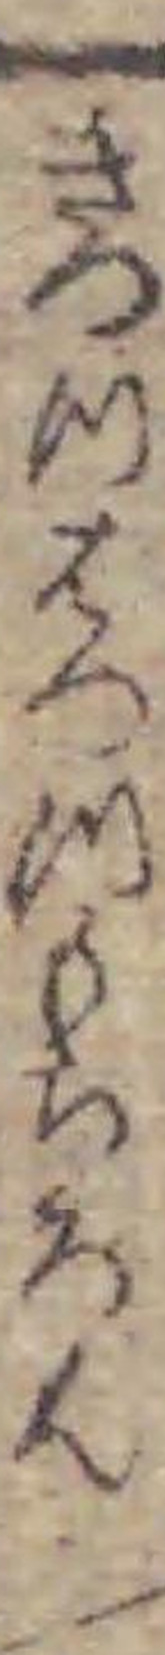きつつはつつもちろん
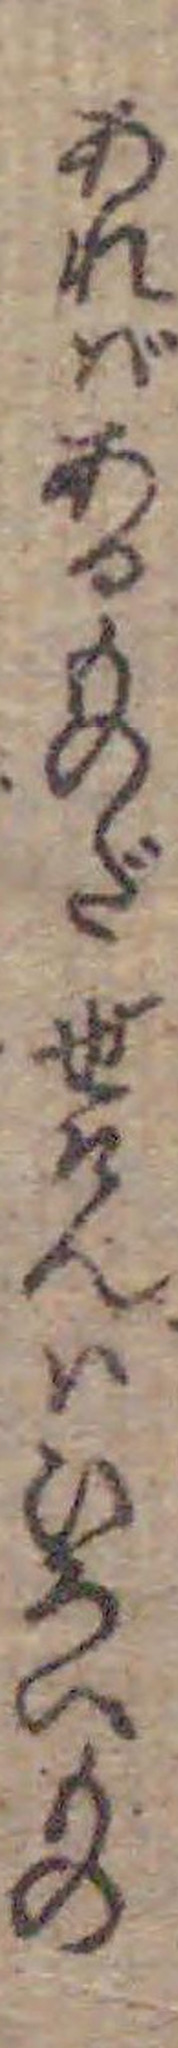あればあるものだ世けんはひろいもの
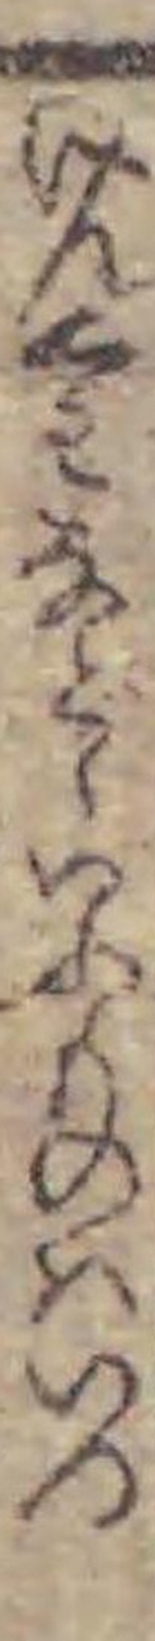けんくわなとゝいふものはいつ
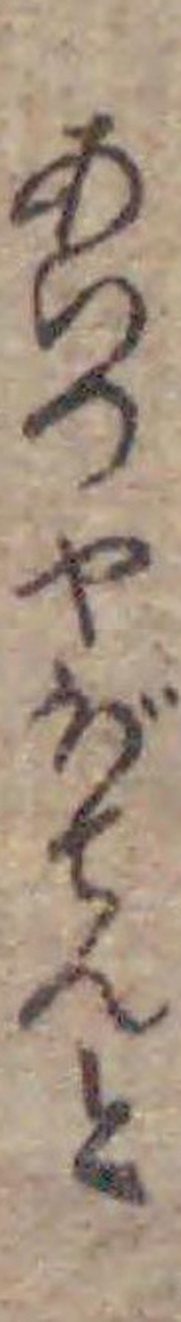あいつやぼてんと
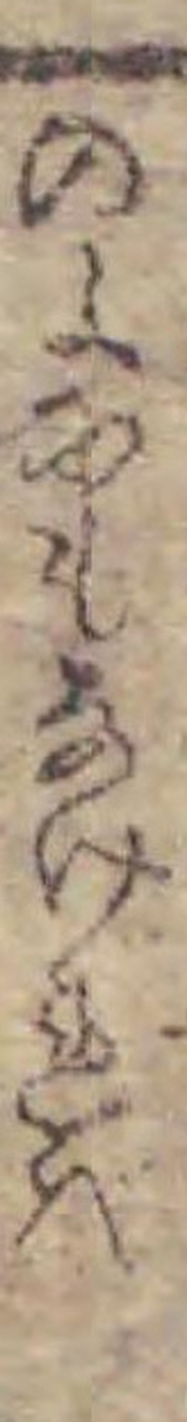のよにもなければ
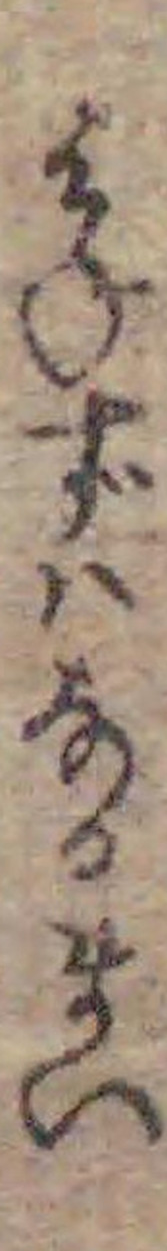はねずはなるまい
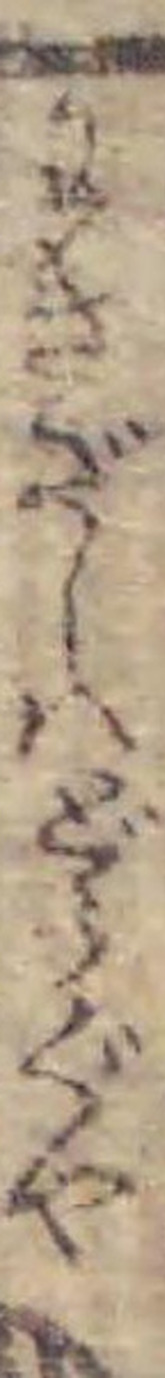わきざしはどうぐや
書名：威気千代牟物語 : 2巻
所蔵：国立国会図書館 National Diet Library, JAPAN
